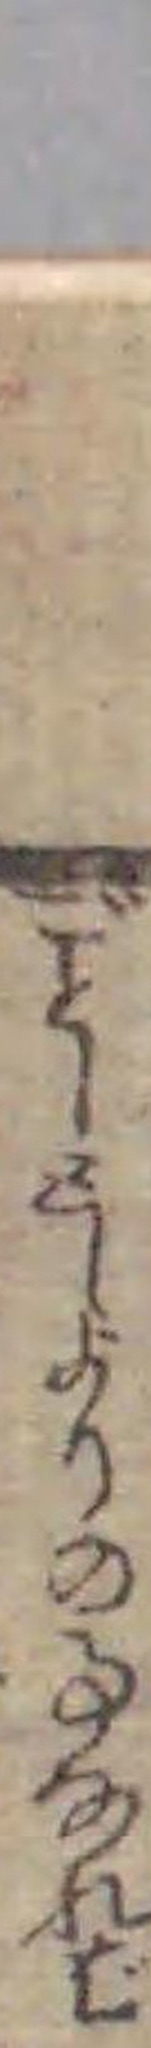ごとしとしよりの事なれば
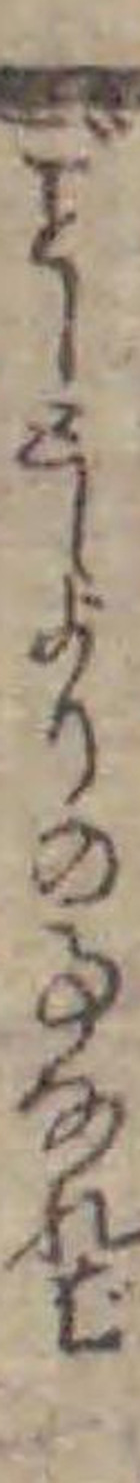ごとしとしよりの事なれば
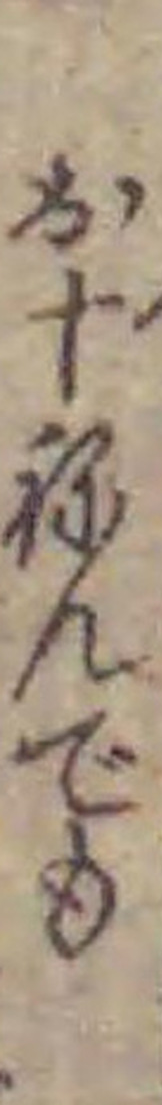お十ねんでも
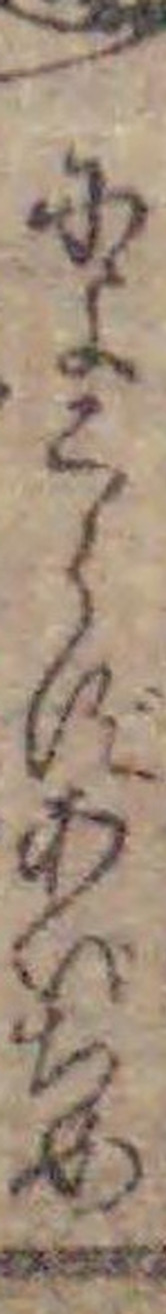によこらずあいちめ
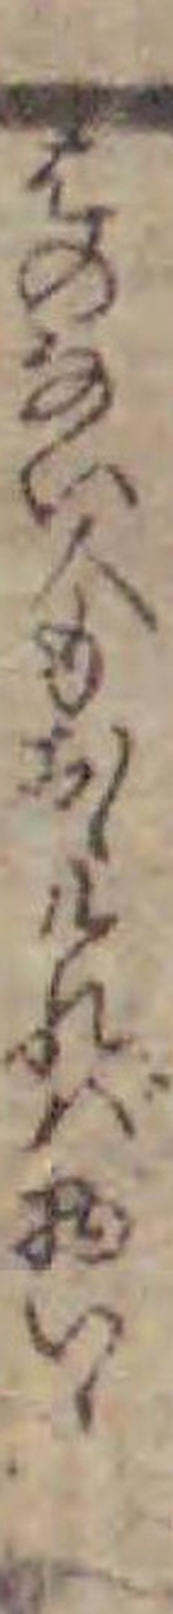はのない人もおゝければ物いゝ
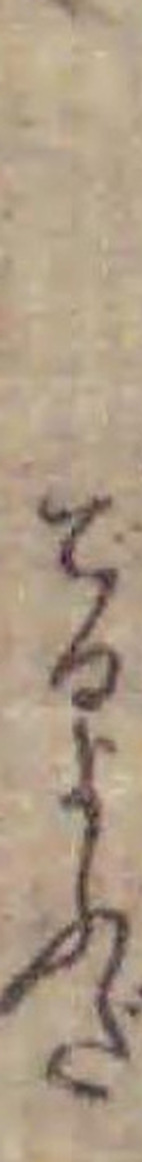でるよふだ
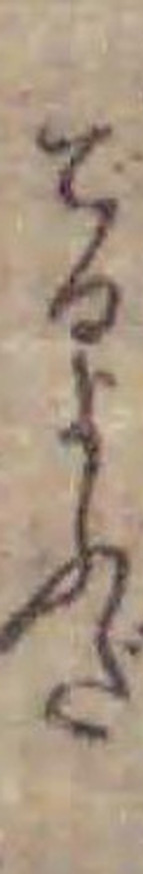でるよふだ
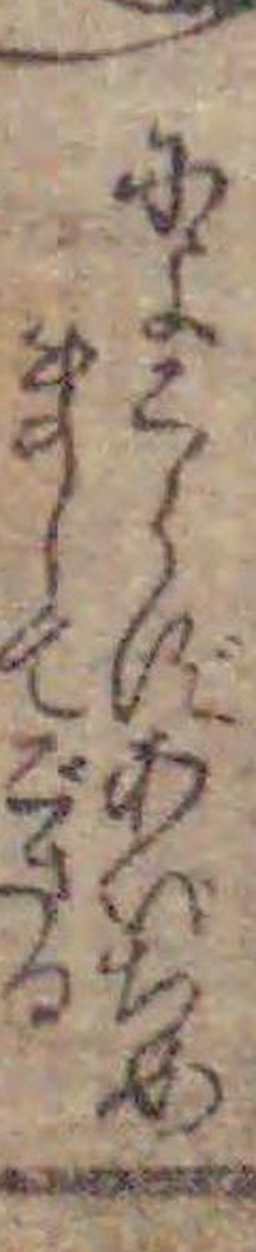ましてごさる
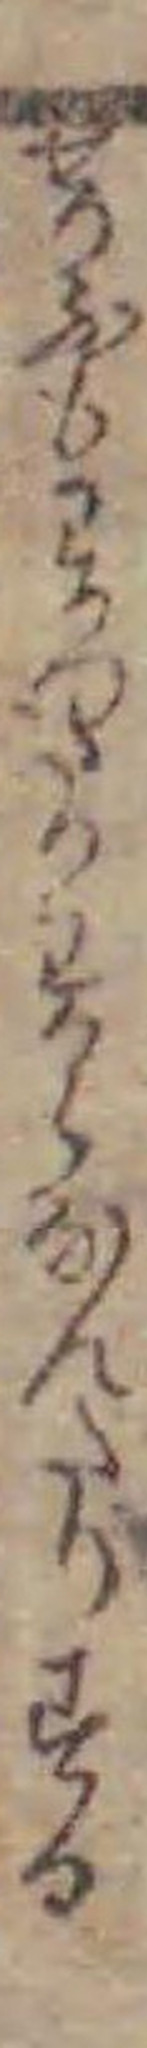せりふもわかつたりわからなんだりする

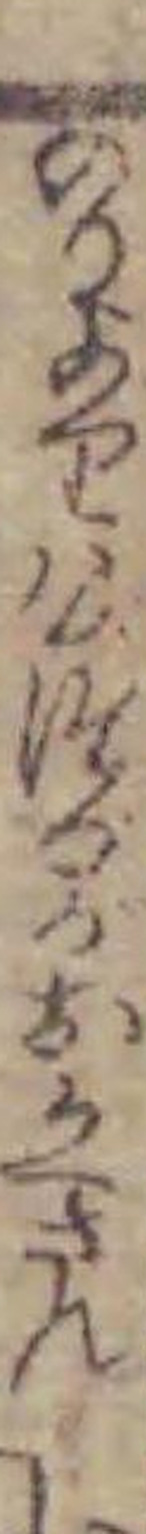のりより公つるがおかへさん
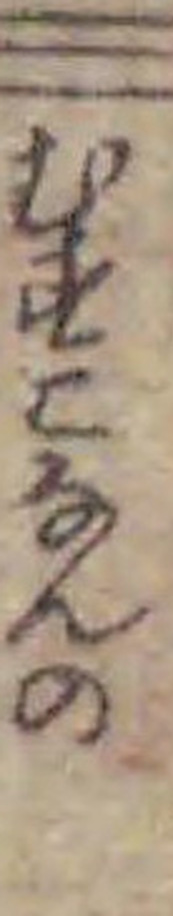むすこなんの
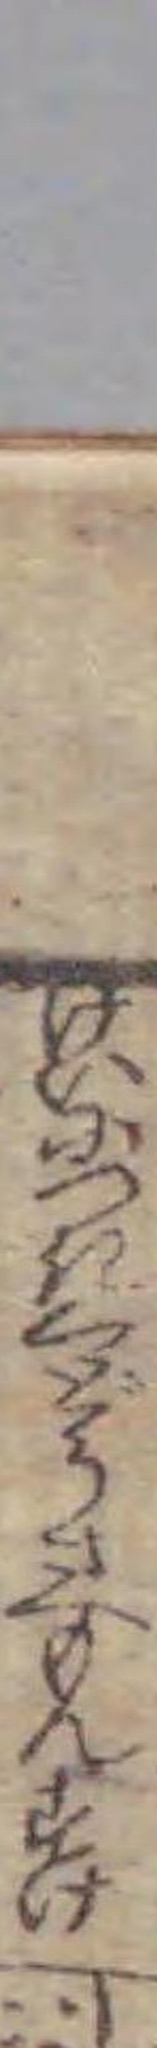けいにつきくどうさへもんすけ
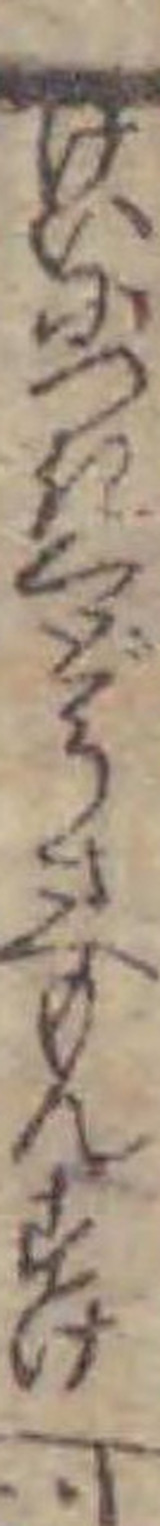けいにつきくどうさへもんすけ
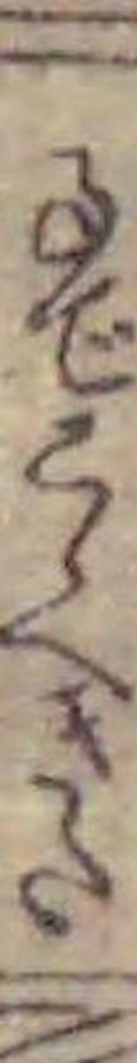事でこゝへきた
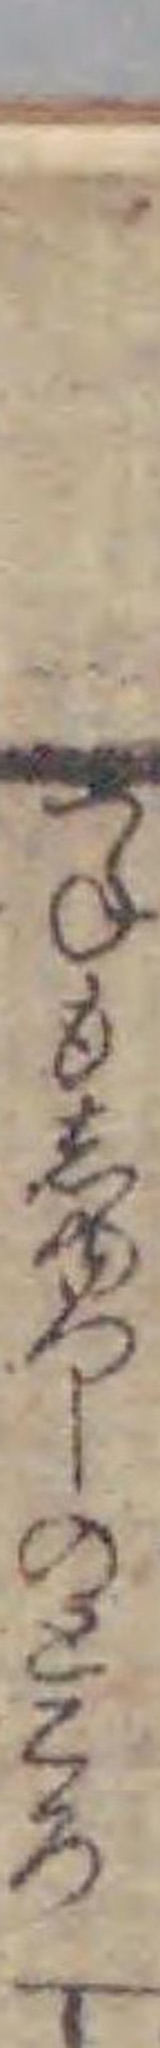つねもしゆつしのところ
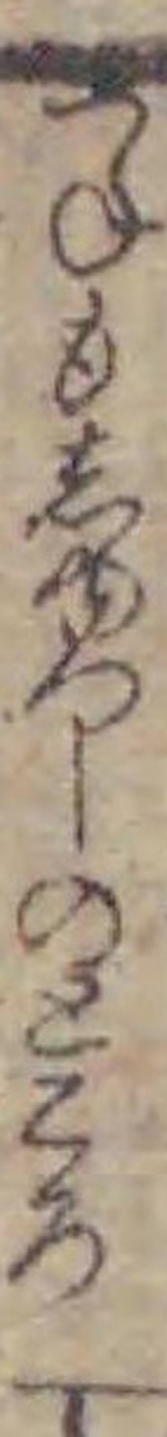つねもしゆつしのところ
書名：年寄之冷水曽我 : 3巻
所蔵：国立国会図書館 National Diet Library, JAPAN
